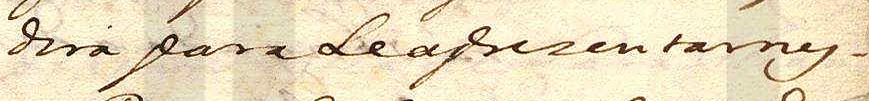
dira para se aprezentar nes
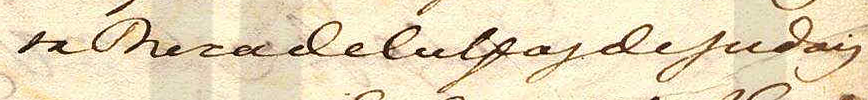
ta Meza de Culpas de judais
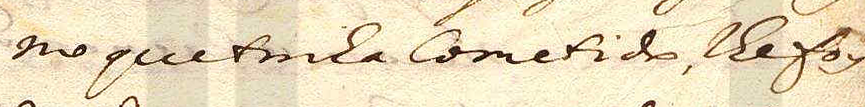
mo que tinha Cometido, lhe foy
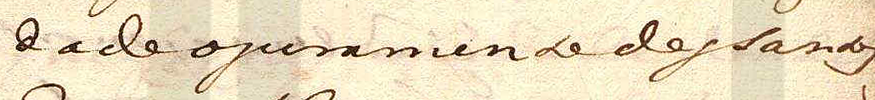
dado o juramento dos santos
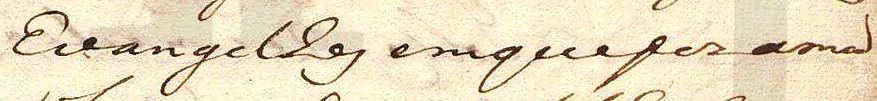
Evangelhos em que poz a maõ
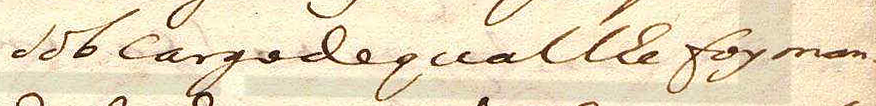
sob cargo do qual lhe foy man
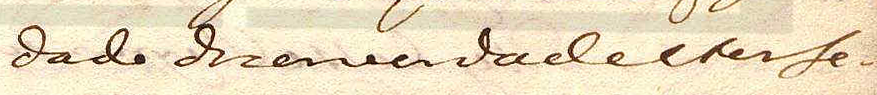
dado dizer verdade e ter se
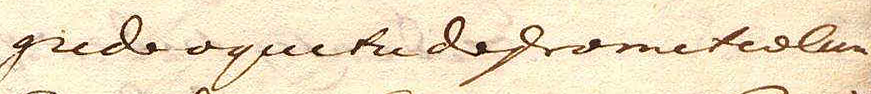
gredo o que tudo prometeo Cum
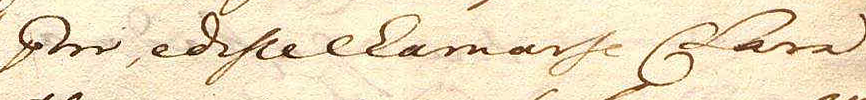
prir, e disse chamarse CLara
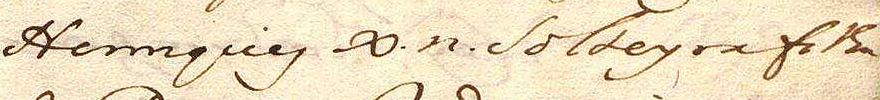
Heniques x. n. Solteyra filha
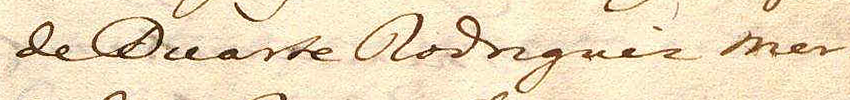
de Duarte Rodriguez mer
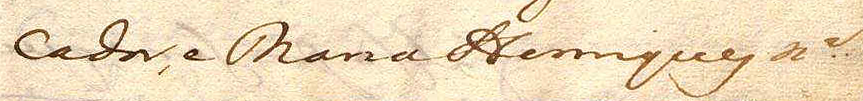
cador, e Maria Henriques n.a
